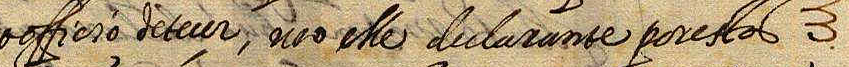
o officio de teçer, veo elle declarante por estas
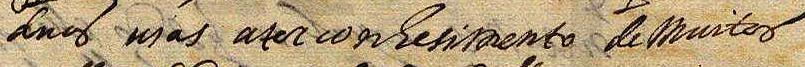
duas vías a ter conhecimento de muitas
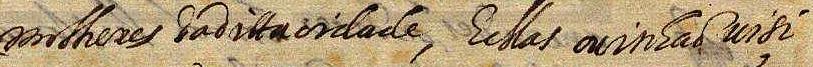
molheres da ditta cidade, e ellas o vinhão visi
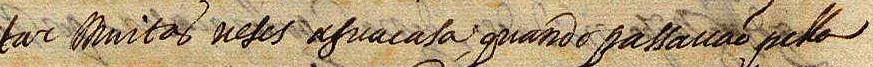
tar muitas veses a sua casa, quando passavão pella
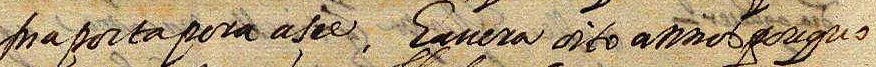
sua porta pera a see, e avera oito annos pouquo
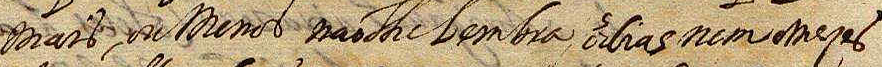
mais, ou menos não lhe lembra os dias nem meses
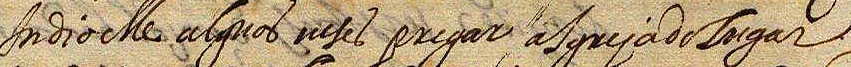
Indio elle alguas veses pregar a Igreja do Lugar
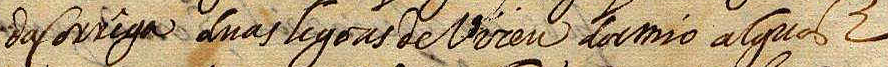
da Corrêga duas legoas de Vízeu dormio algūas
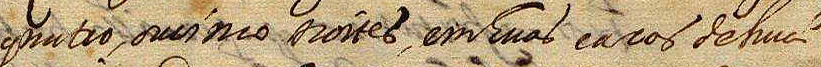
quatro, ou cinco noites em hūas cazas de hūa
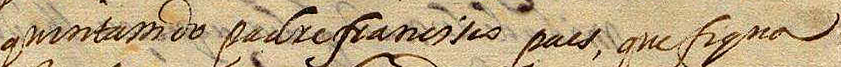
quintam do padre Francisco paes, que fiqua
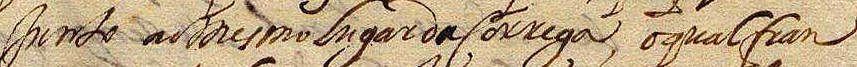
Junto ao mesmo Lugar da Corrêga, o qual Fran
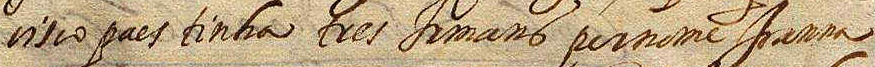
cisco paes tinha tres Irmãns per nome Joanna
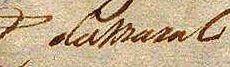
damaral
